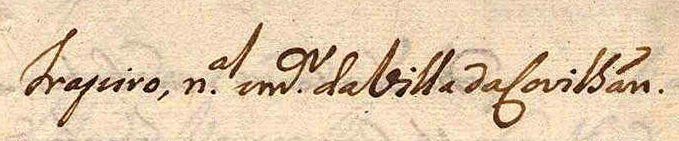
trapeiro, n.al e m.or da Villa da Covilhãn.
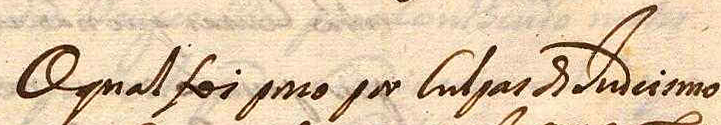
O qual foi prezo por Culpas de Iudaismo
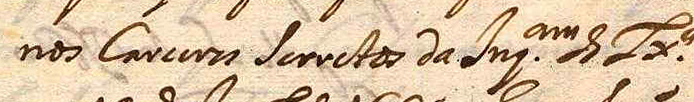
nos Carceres Secretos da Inq.am de Lx.a
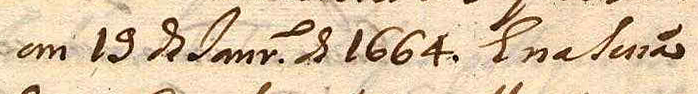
em 19 de Ianr.o de 1664. E na Sessão
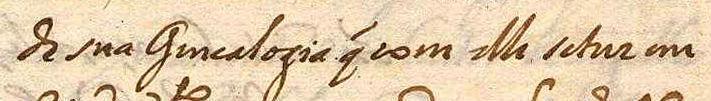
de sua Genealogia q̄ com elle se teue em
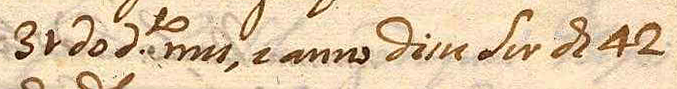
31 do d.o mes, e anno disse ser de 42
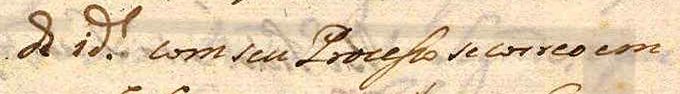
de id.e com seu Processo se correo em
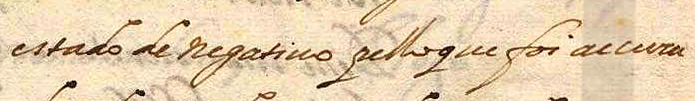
estado de negatiuo pello que foi accuza
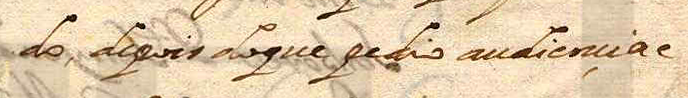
do, depois do que pedio audiencia e
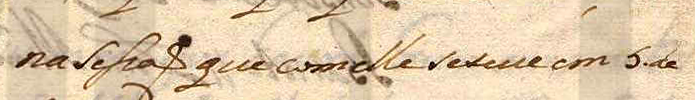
na sessaõ que com elle se teue em 5. de
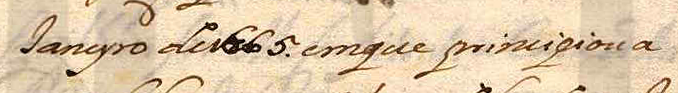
Ianeyro de 1665. em que principiou a
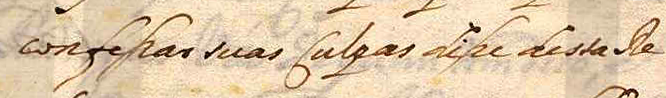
confessar suas Culpas disse desta Re
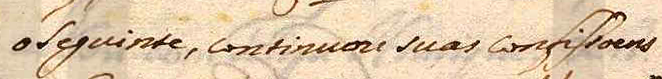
o seguinte, continuou suas confissoens
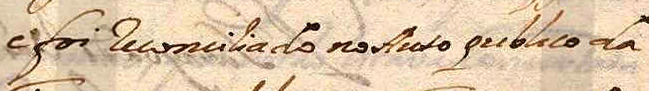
e foi Reconciliado no Auto publico da
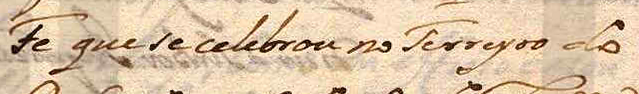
Fe que se celebrou no Terreyro do
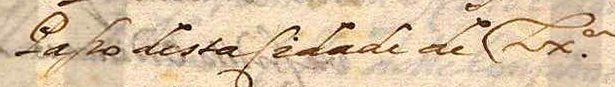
Passo desta Cidade de Lx.a
